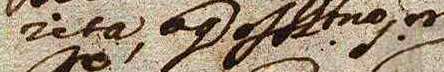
zita, o q̄ o Jllm.o S.or
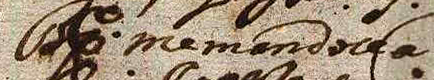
Bp.o me mandoua
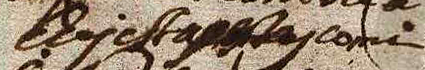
E hoje esta partes comi
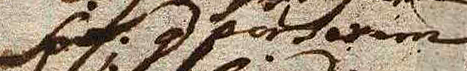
sej; q̄ por serem
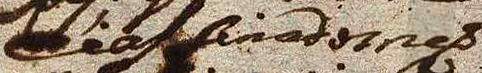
ia assinados naõ
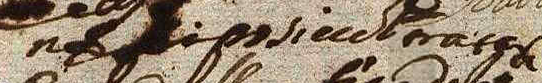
naõ foi posiuel tratar
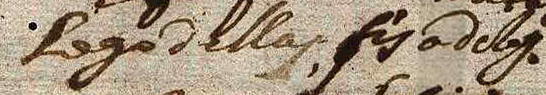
Logo dellas, fis a delig.a
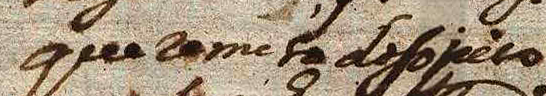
que remeto do sojeito
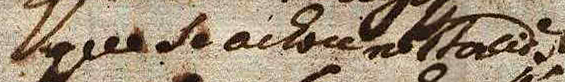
que se achou nesta cid.e
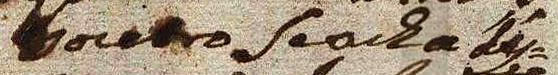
_ outro se acha des
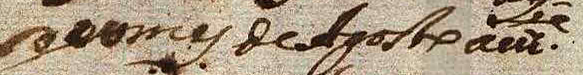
de o mes de Agosto auz.te
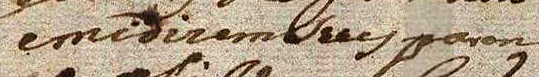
e mi dizem seus paren
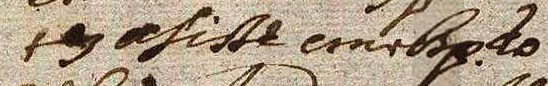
tes asiste em o bisp.do
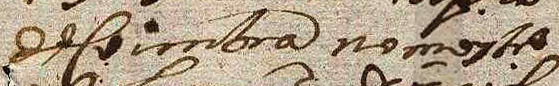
de Coimbra no mostr.o
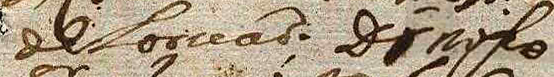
de Loruaõ. Ds̄ nosso
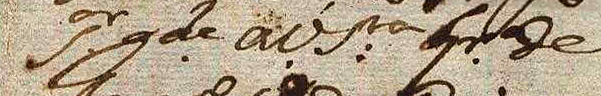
s.or gde a VS.ra Lx.a de
